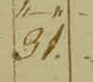31.
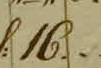16.
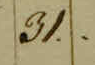31.
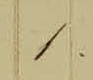1
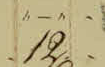12.
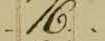16.
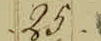25
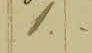1.
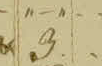3.
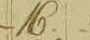16.
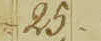25
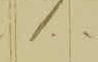1.
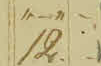12.
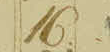16.
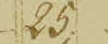25.
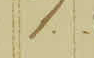1.
